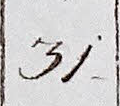31
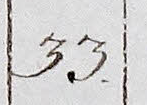33.
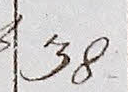38
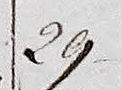29
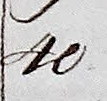40
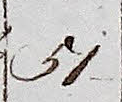51
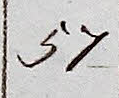57
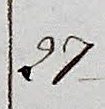27
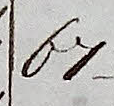67
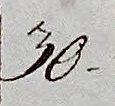30
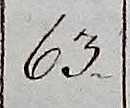63
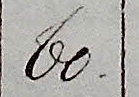60
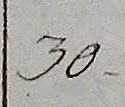30
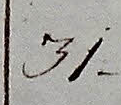31
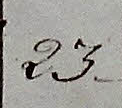23
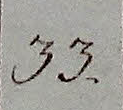33
